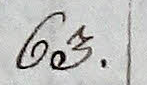63.
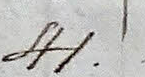41.
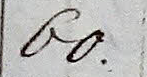60.
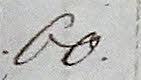60.
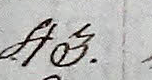43.
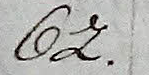62.
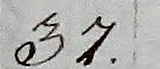37.
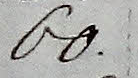60.
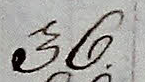36.
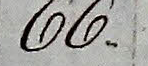66.
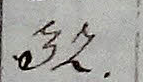32.
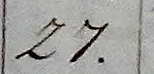27.
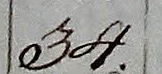34.
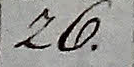26.
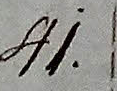41.
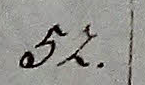52.
